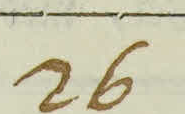26
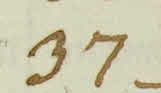37
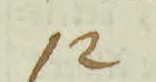12
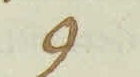9
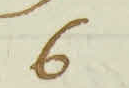6
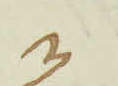3
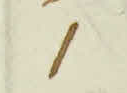1
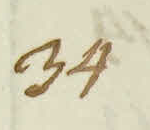34
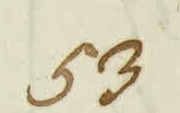53
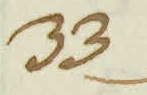33
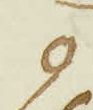9
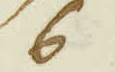6
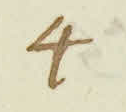4
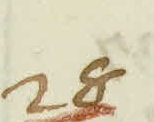28
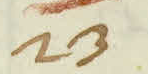23
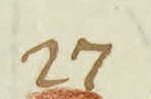27
